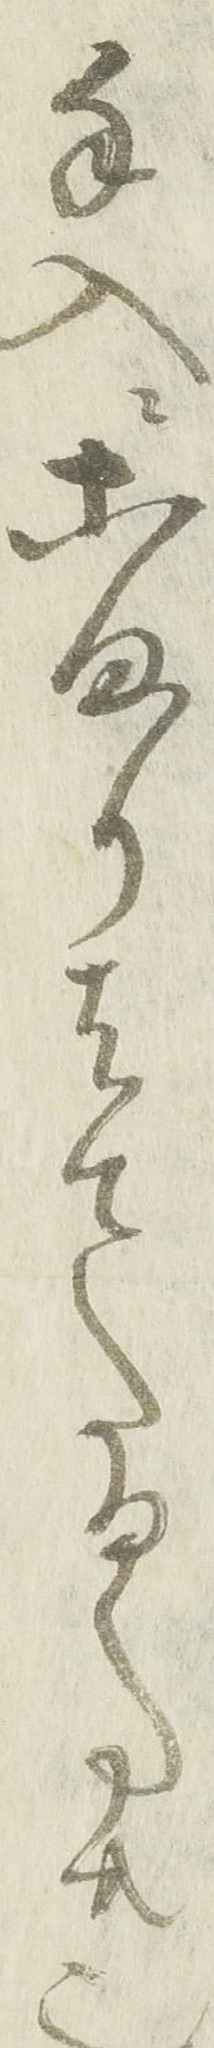手入ニこまりはてたる事共也
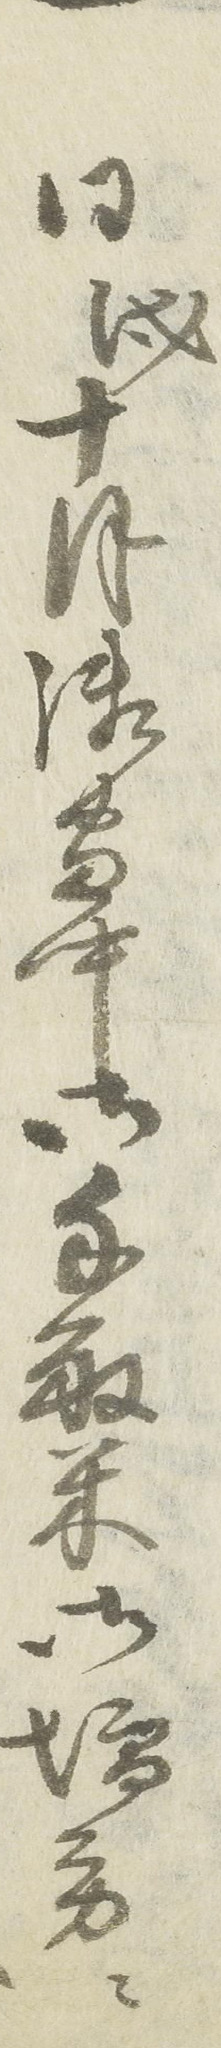一同戌十月御家中御手取米御増方ニ
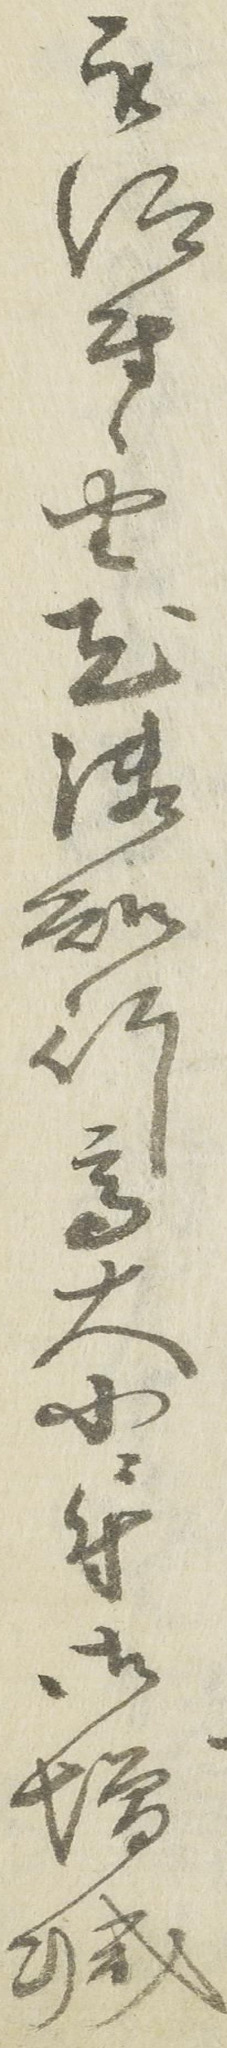被仰付候由尤御知行高大小ニ付御増減

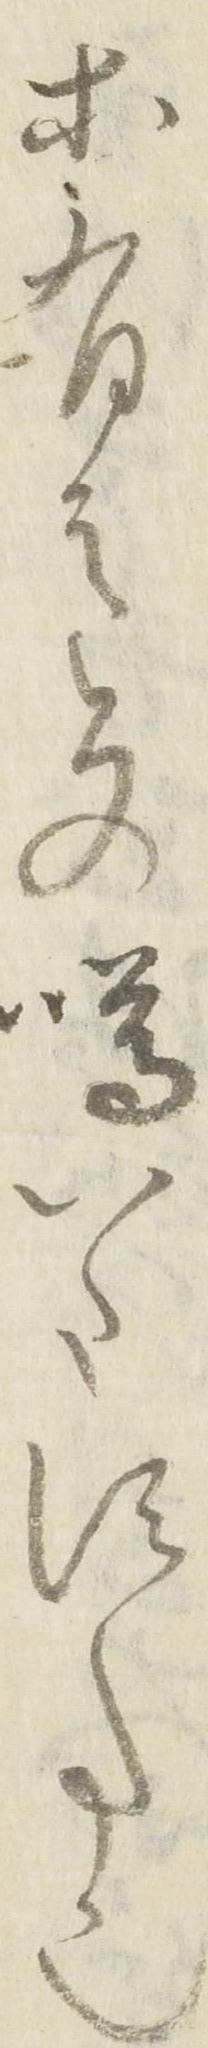等有之との噂いたす事也
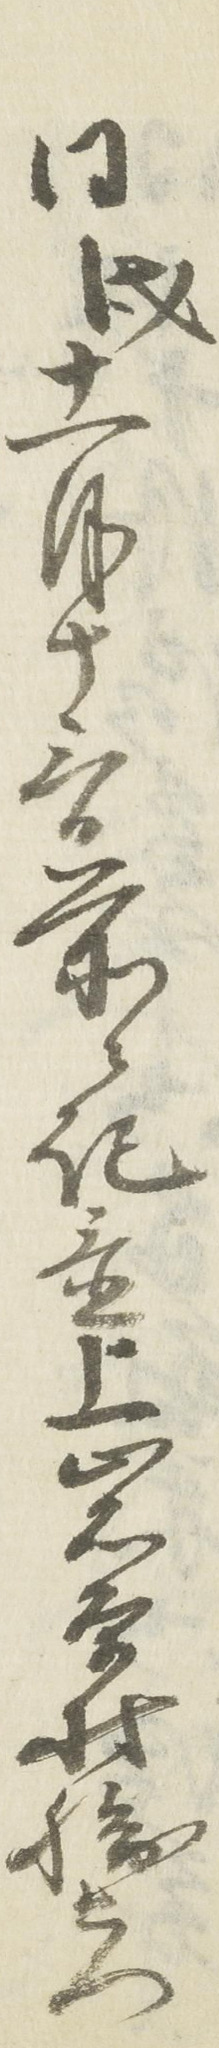一同戌十一月十三日前〻記置上岩原村勝右衛門
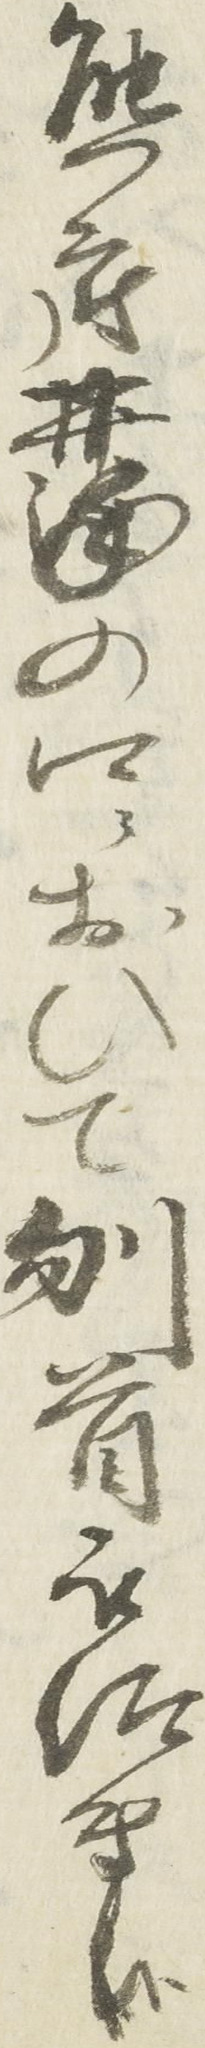熊府井手の口ニおひて刎首被仰付候
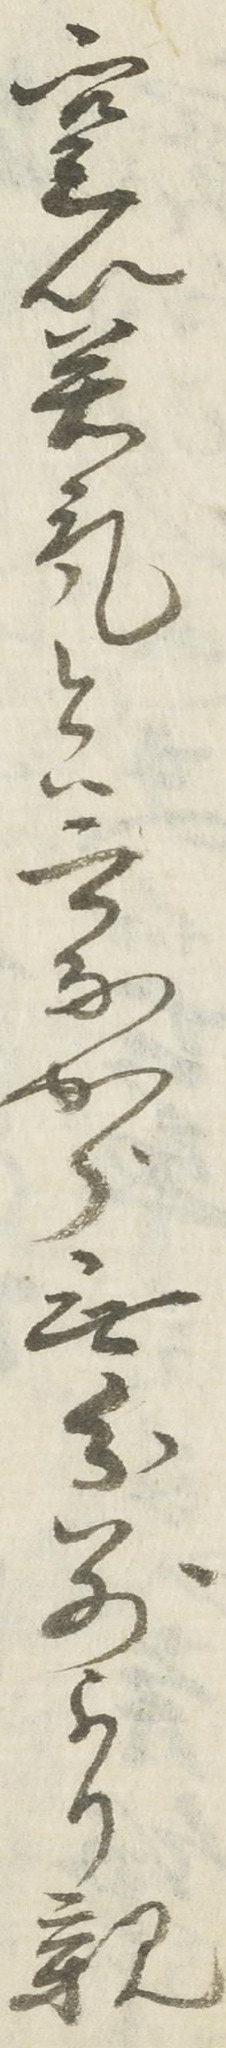寔以若気とは云なから無分別より親
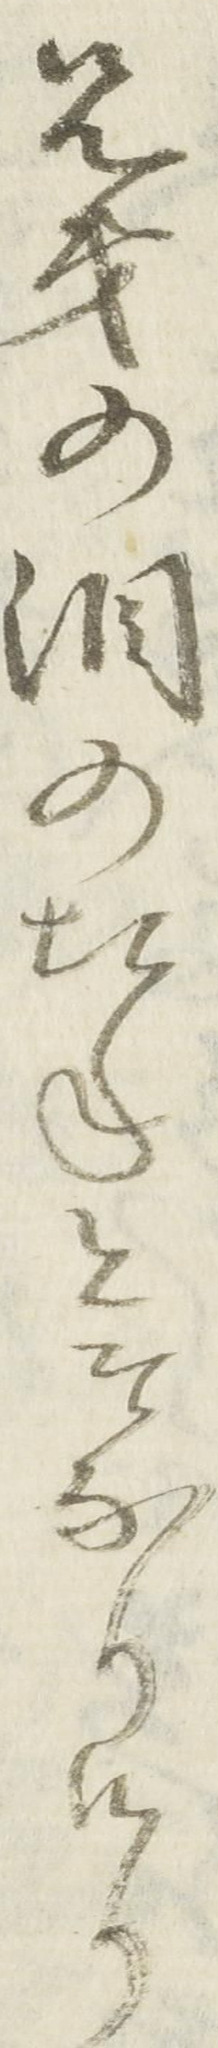兄弟の泪のたねとそなりけり
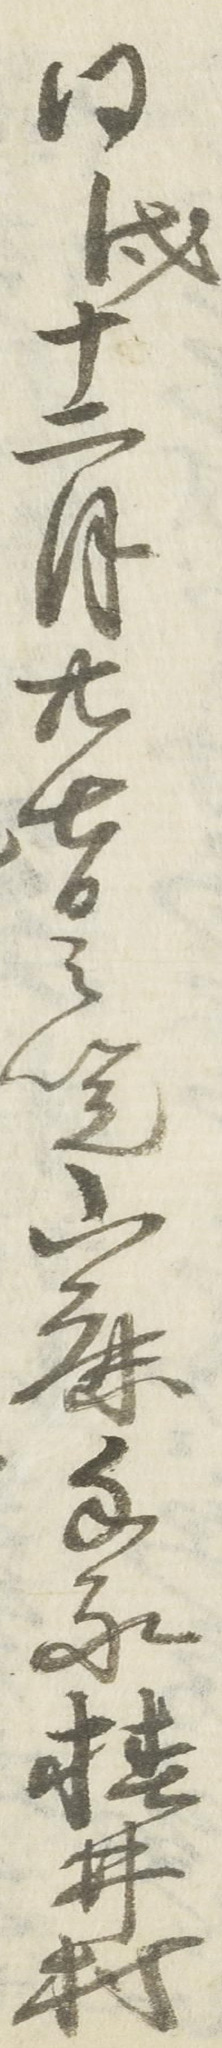一同戌十二月廿七日之晩山鹿手永椿井村
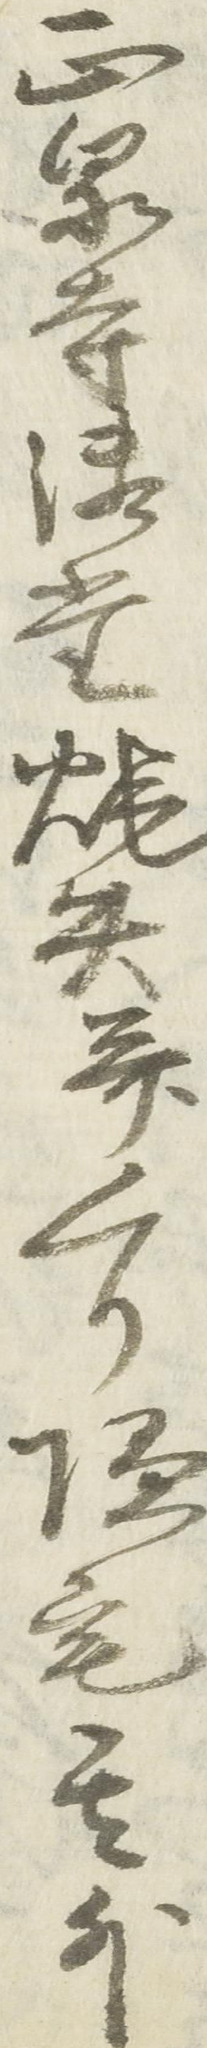正泉寺御堂焼失幷くり隠宅其外
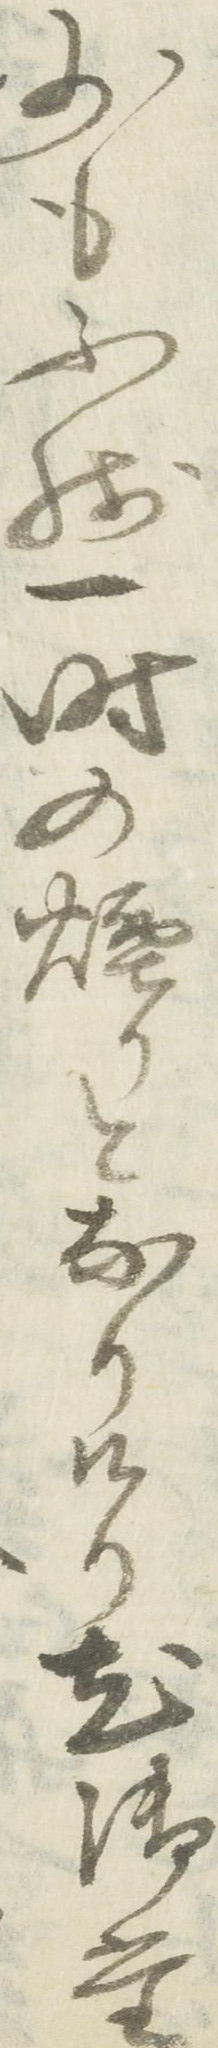少も不残一時の煙りとなりけり尤御堂
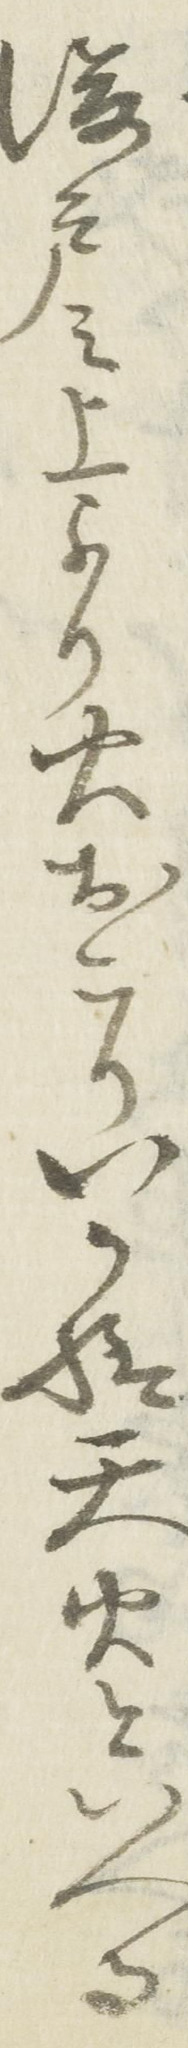渡戸之上より火おこりいか様天火といへる
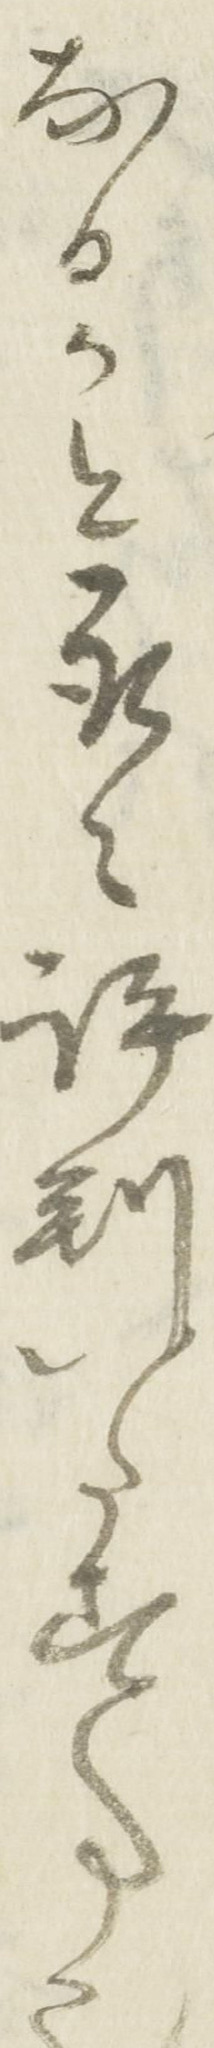なるかと取〻評判いたす事也
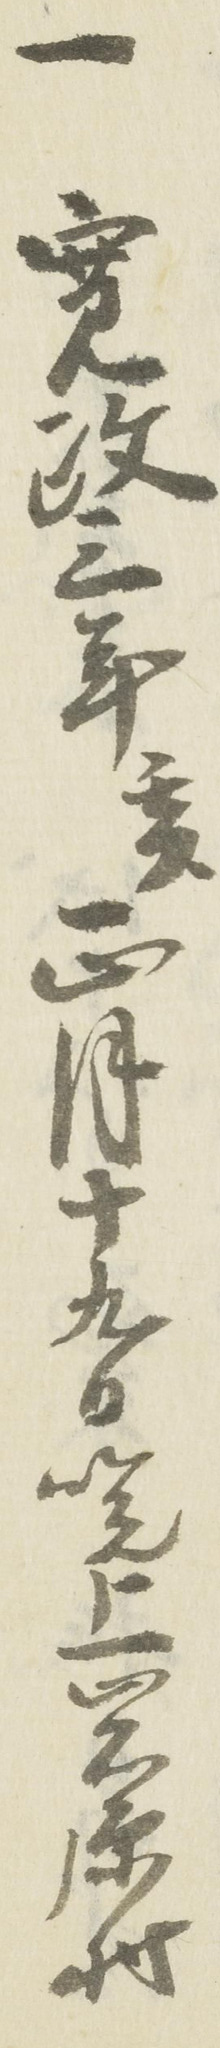一寛政三年亥正月十九日晩上岩原村
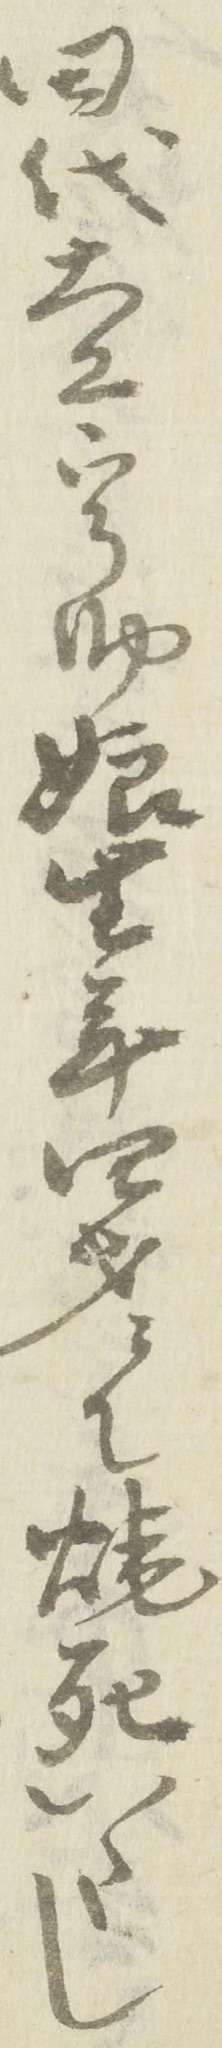田代大工宇助娘生年四才ニて焼死いたし
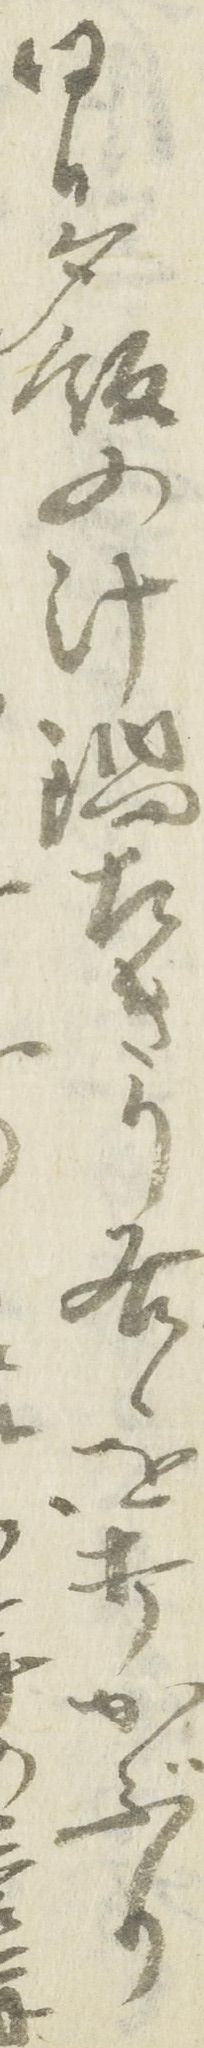同日夕飯の汁湯たきり居候を打かぶり
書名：後見笑
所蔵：東京大学地震研究所図書室 Earthquake Research Institute Library, The University of Tokyo, JAPAN
